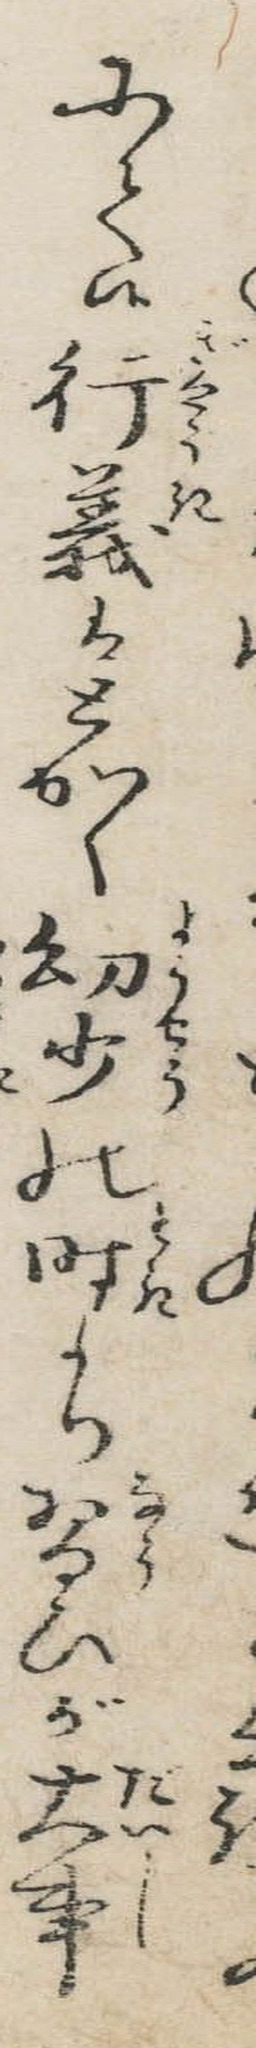にて候行儀はとかく幼少の時より習ひが大事
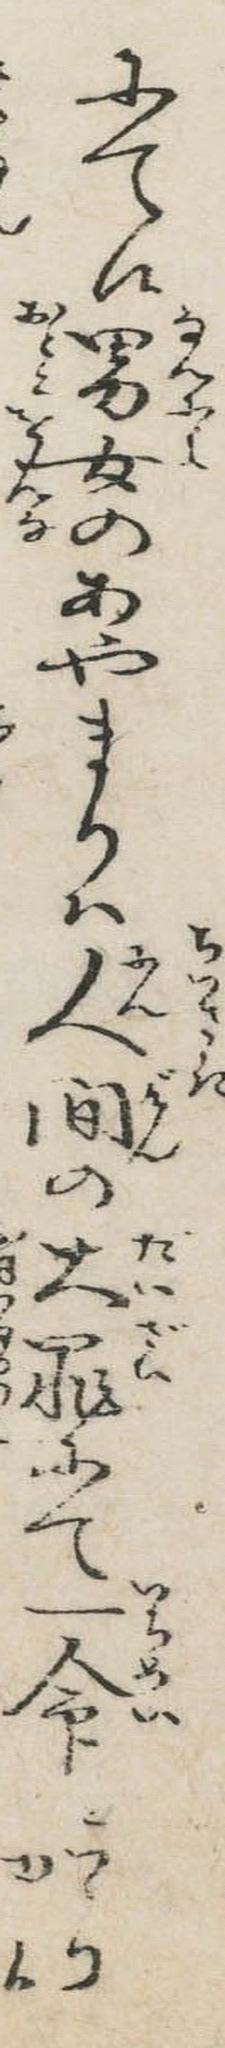にて候男女のあやまりは人間の大罪にて一命にかゝり候
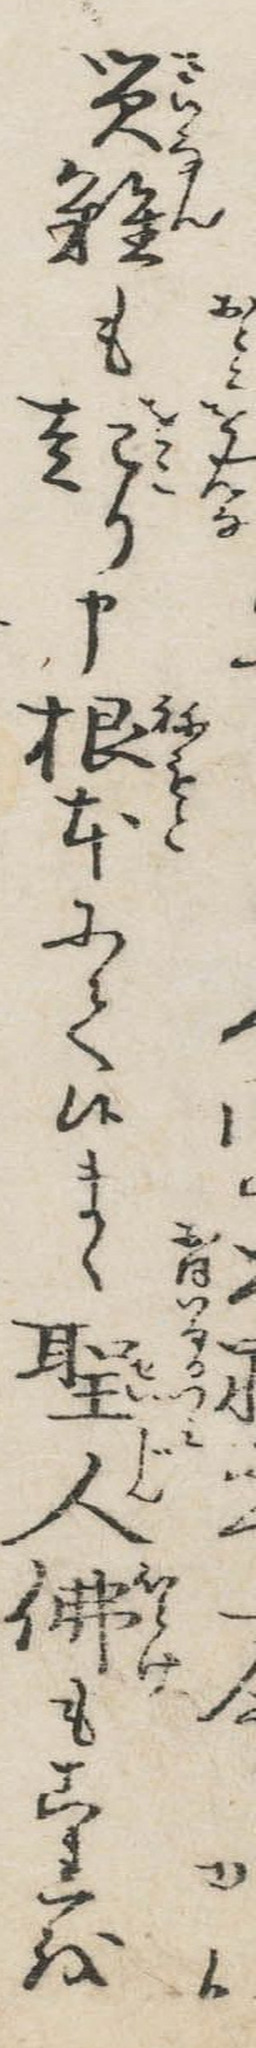災難も起り申根本にて候まゝ聖人仏もこれを
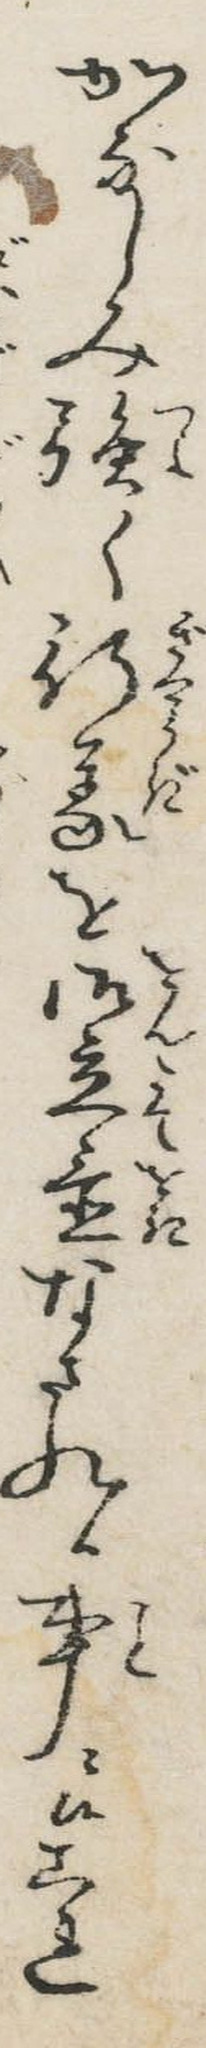かなしみ強く行義を御立置なされ候事に候これ
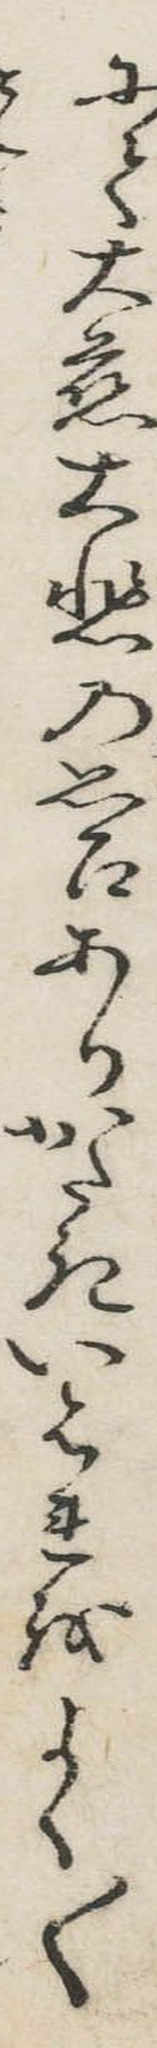にて大慈大悲の思召ありかたきいはれをよく〳〵
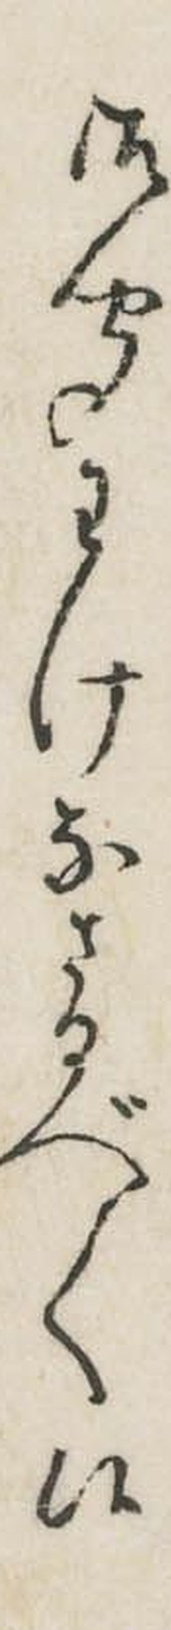御聞わけなさるべく候
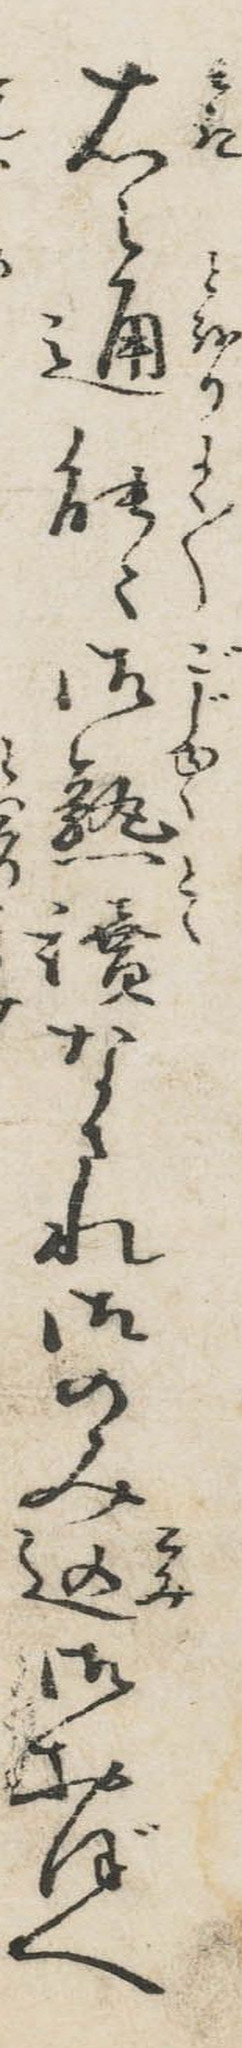右之通能々御熟読なされ御のみ込御おぼへ
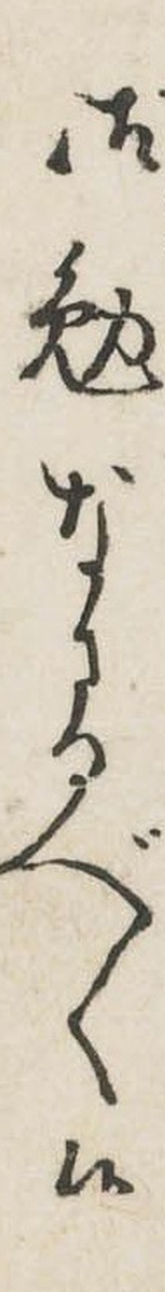御勉なさるべく候
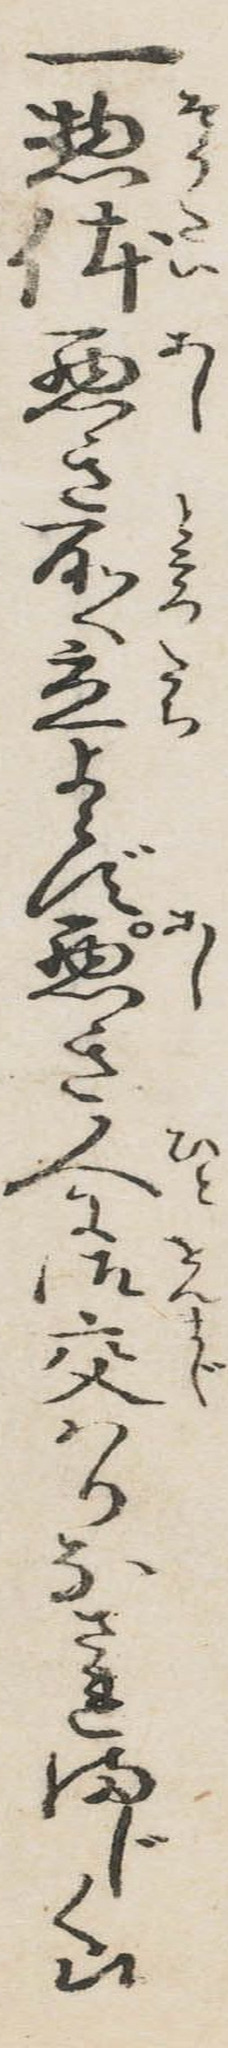一惣体悪き所へ立よらず。悪き人に御交はりなされまじく候
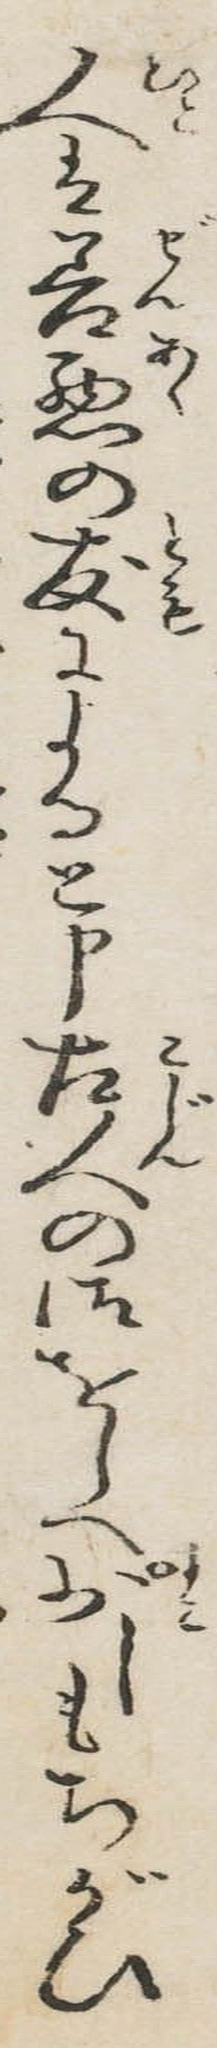人は善悪の友によると申古人の御をしへ。少しもちがひ
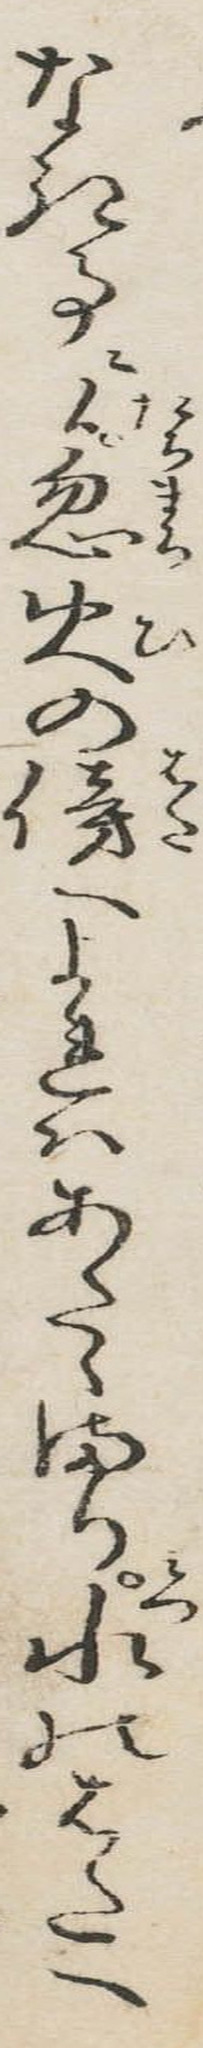なき事に候。忽火の傍へよれはあたゝまり。水のはたへ
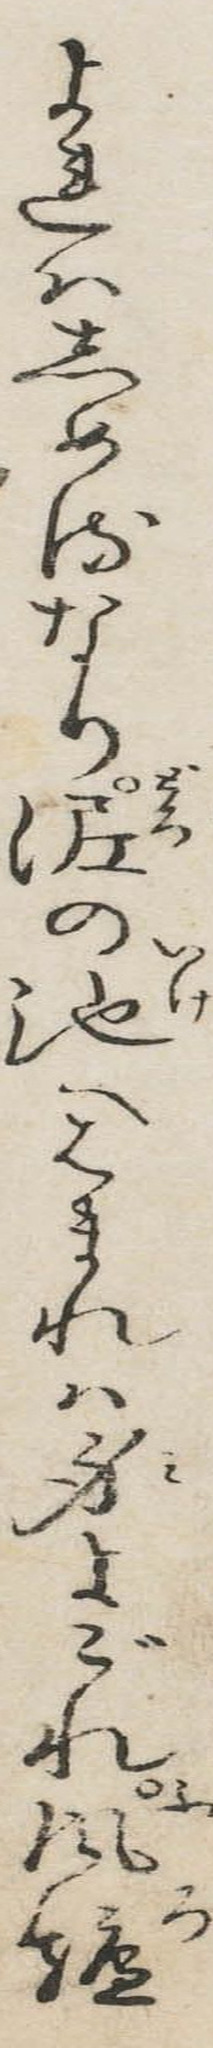よれはしめるなり。泥の池へはまれは身よごれ。風爐
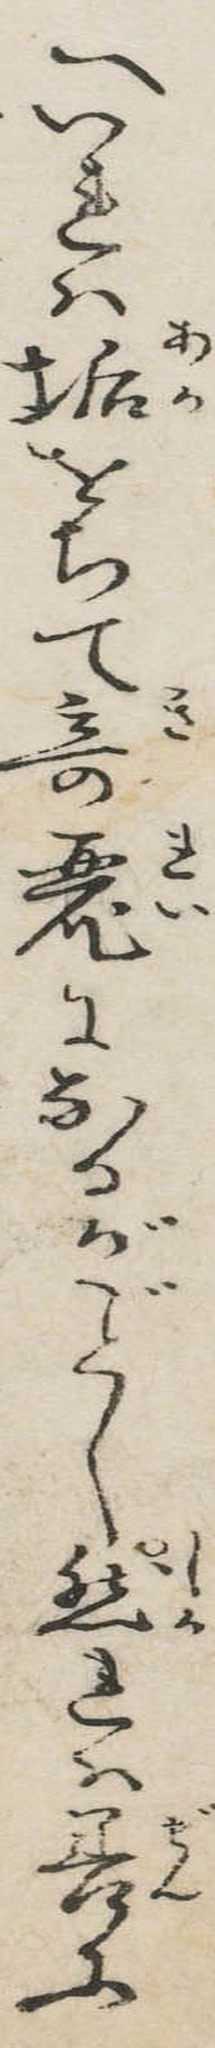へいれは垢をちて奇麗になるがごとし。然れは善に
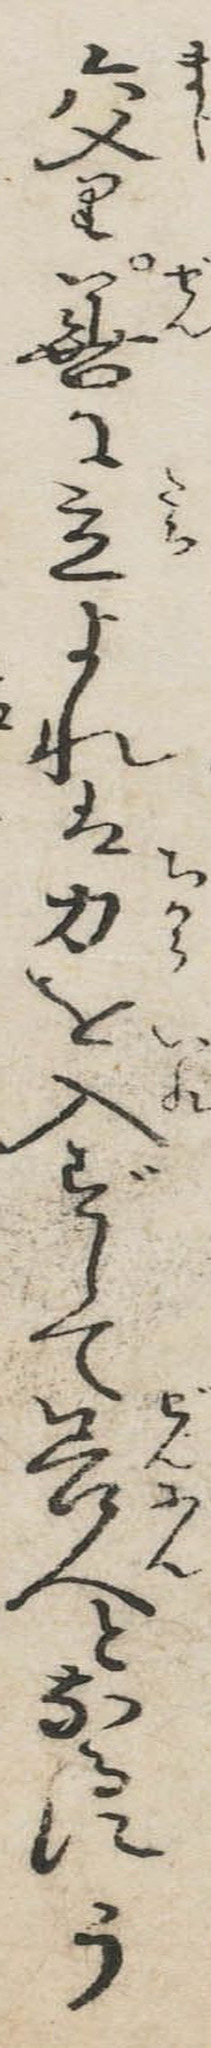交り。善に立よれは力を入ずして善人となるにう
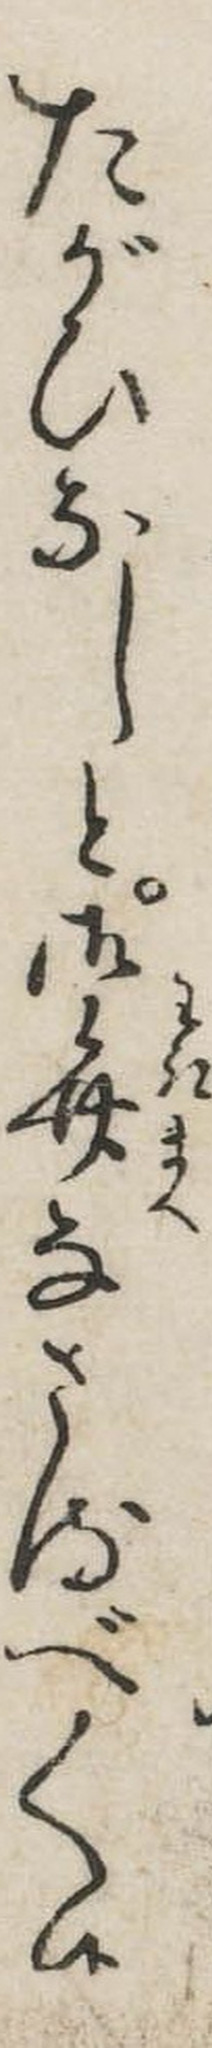たがひなしと。御弁なさるべく候
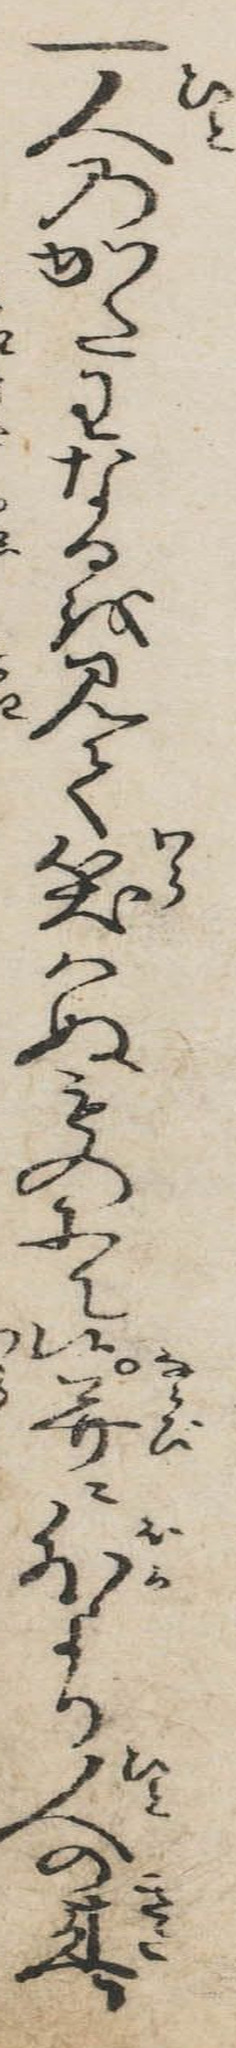一人のかたわなるを見て笑はぬものにて候并に外より人の来り
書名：前訓
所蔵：東京学芸大学附属図書館
